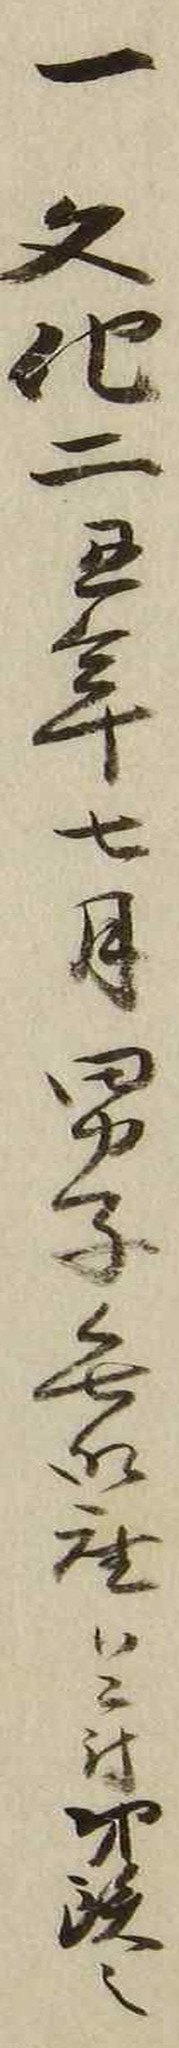一文化二丑年七月男子無御座候ニ付弟銕之
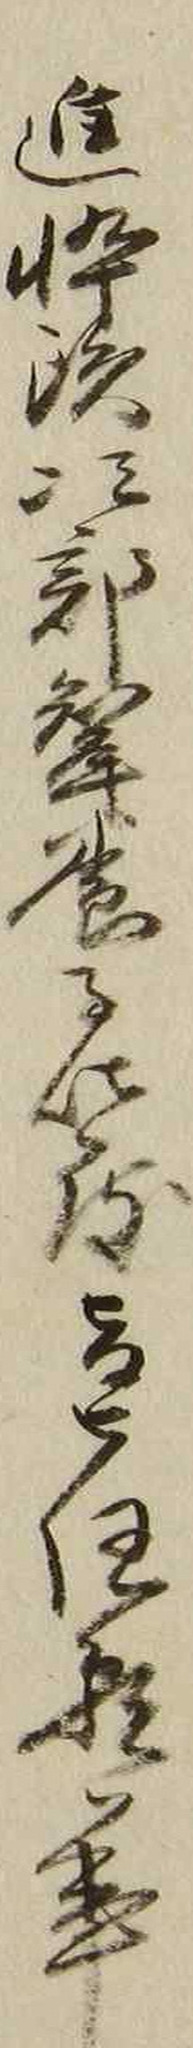進忰鉄次郎聟養子仕度旨被任願候事
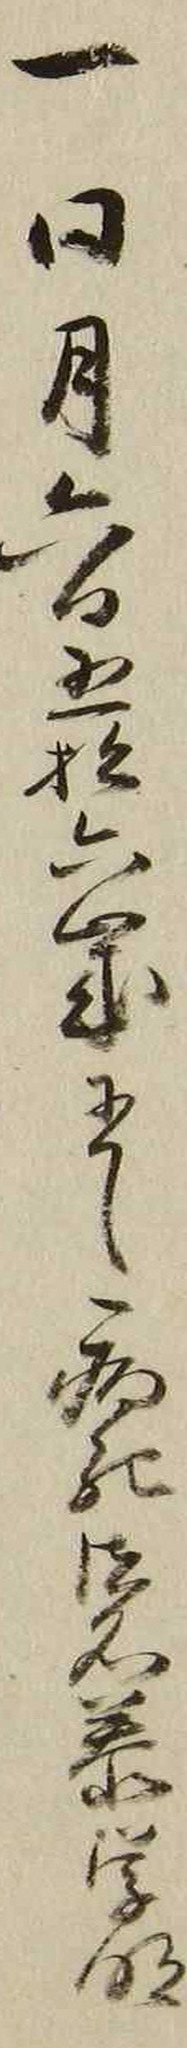一同月六日五拾六歳にて病死法名泰学明
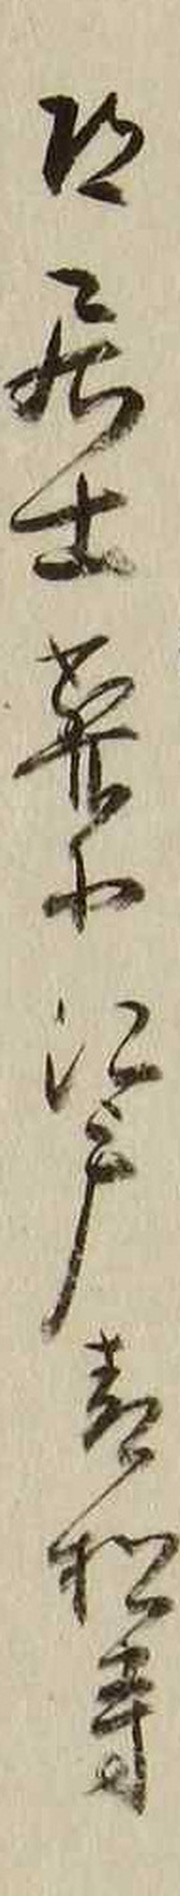道居士葬所江戸青松寺
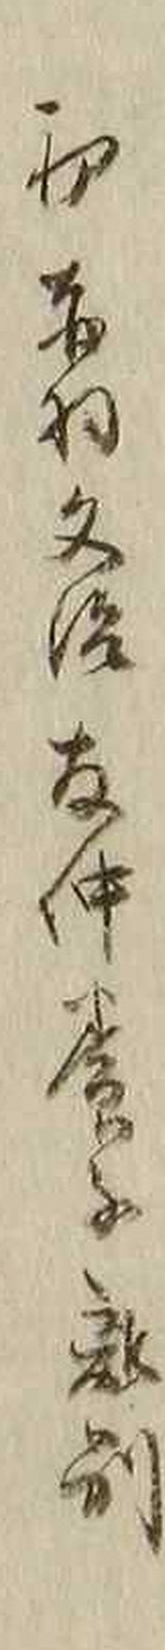初赤羽文治友仲養子離別
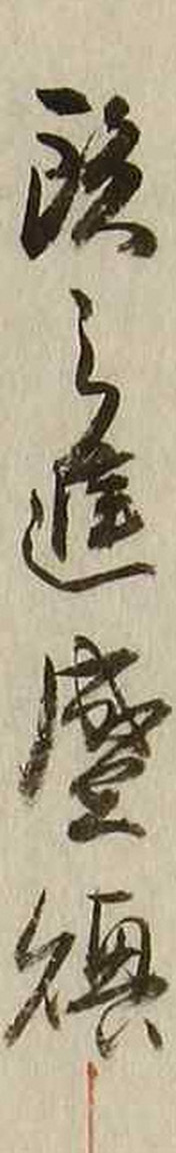鉄之進盛煥
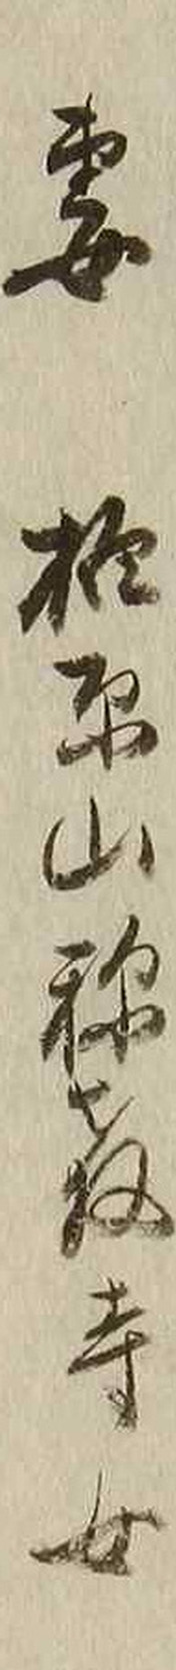妻柏原山称教寺女
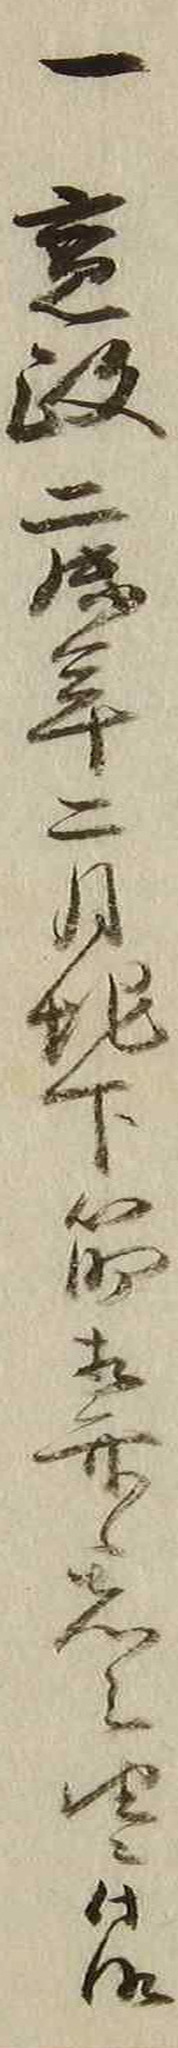一寛政二戌年二月地下筋相弁候者之由ニ付御
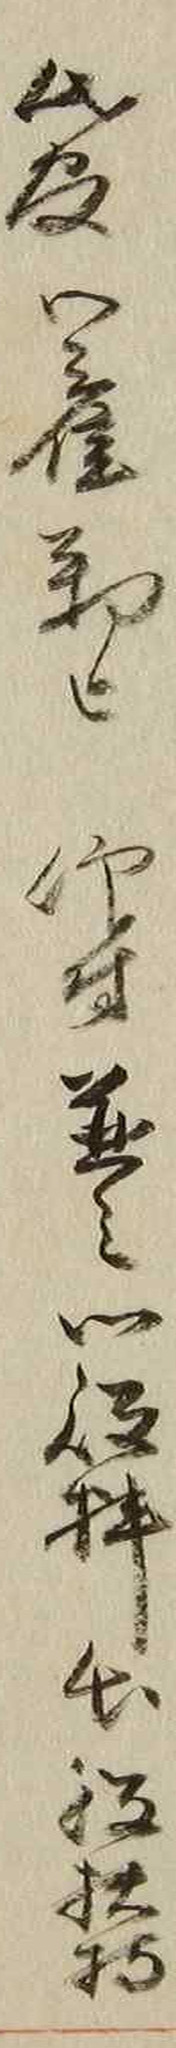代官御雇勤被仰付並之御役料出役扶持
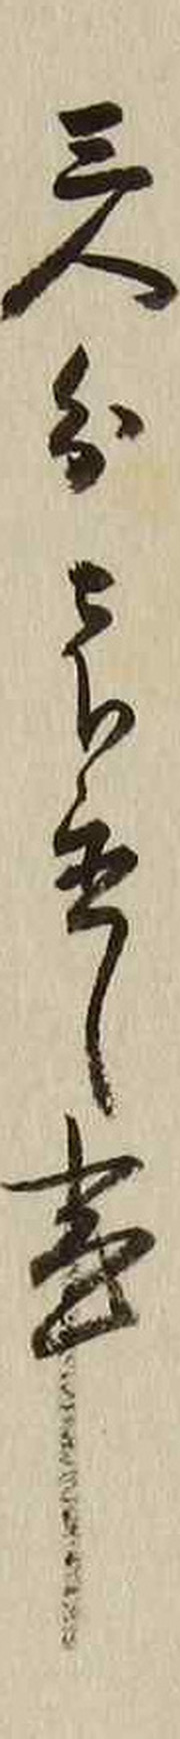三人分被下置候事
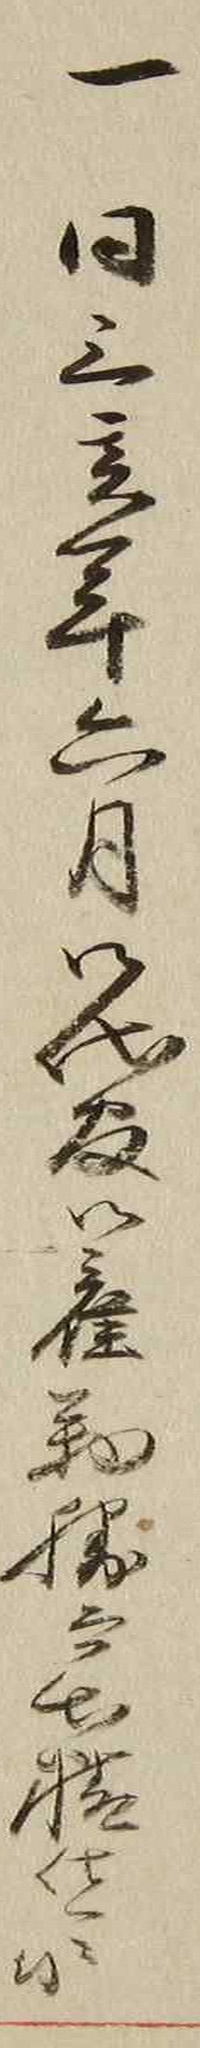一同三亥年六月御代官御雇勤勝而出精仕候ニ付
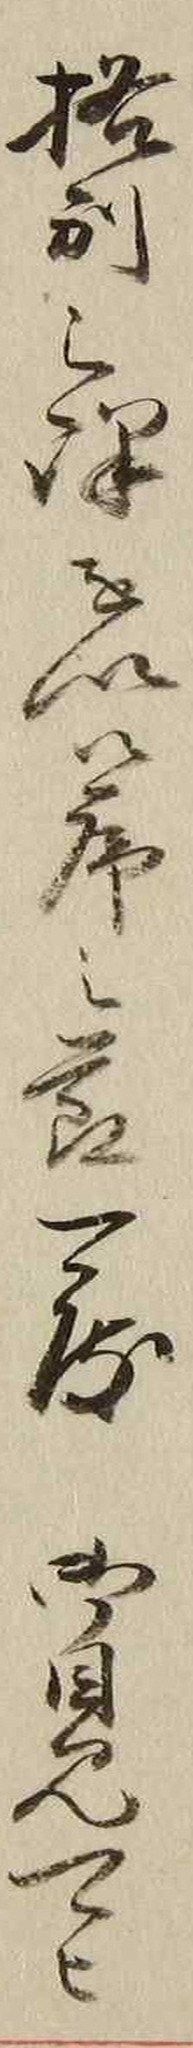格別之訳を以御席之節可致御目見可被
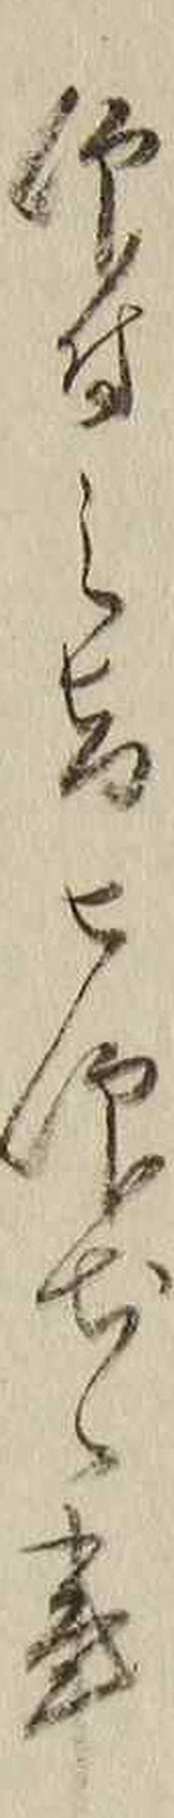仰付之旨被仰出候事
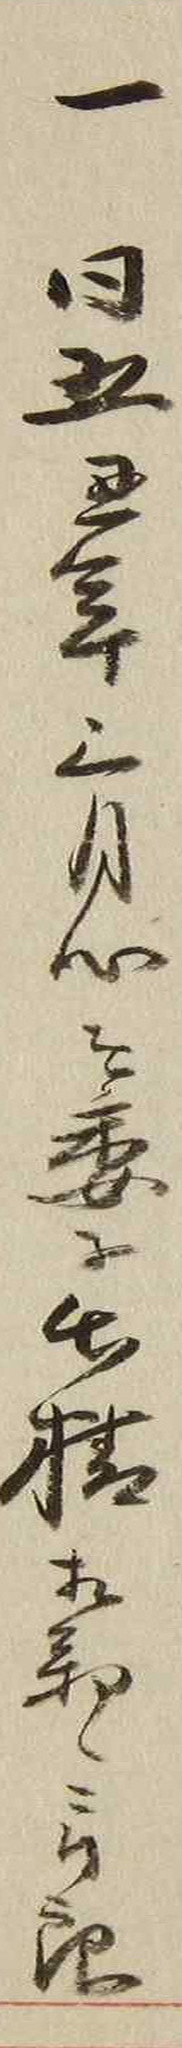一同五丑年三月心を委に出精相勤候ニ付銀
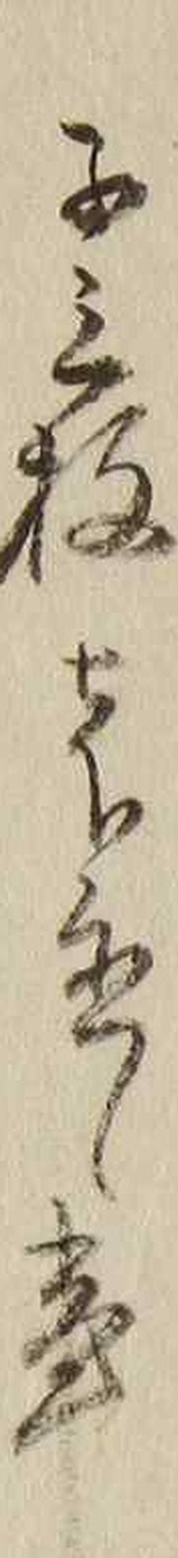子三枚被下置候事
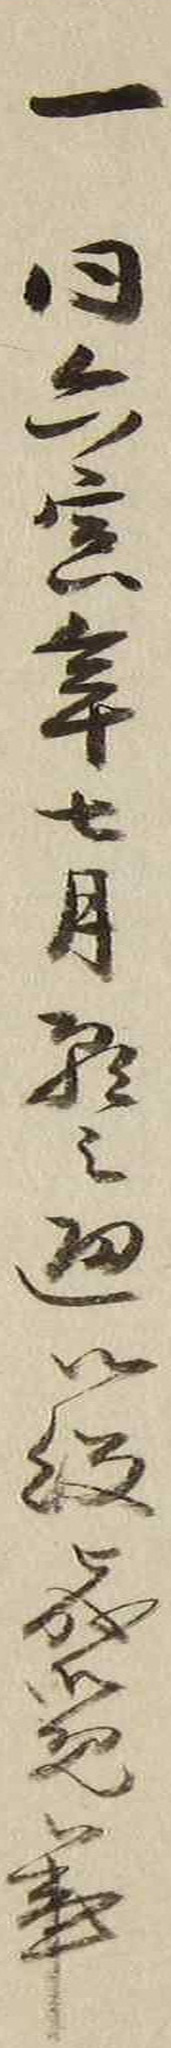一同六寅年七月願之通御役被成御免候事
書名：諸士系譜　巻之325　し之部15
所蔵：会津若松市立会津図書館
